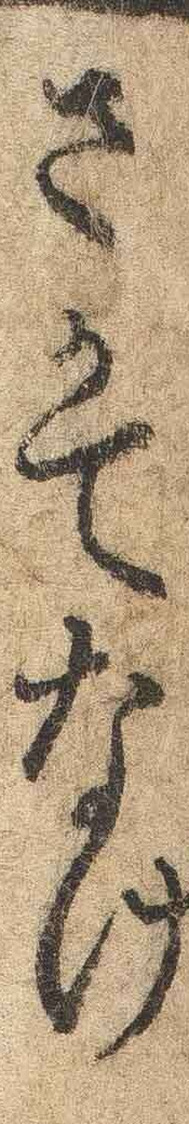さかてなげ
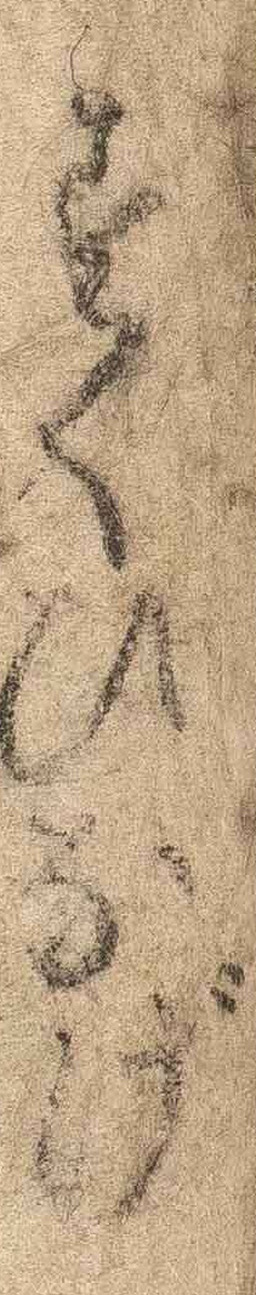すくひなげ
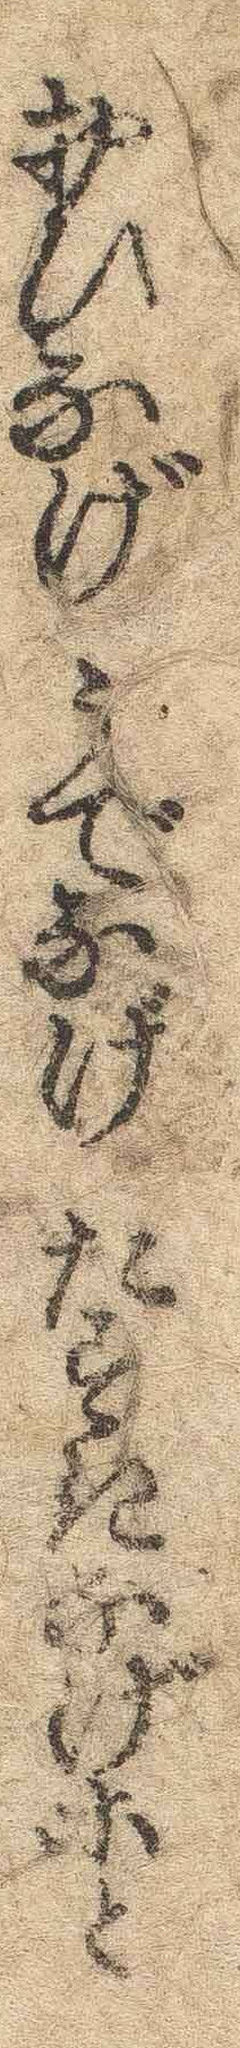おひなげこでなげたすきなげ等と
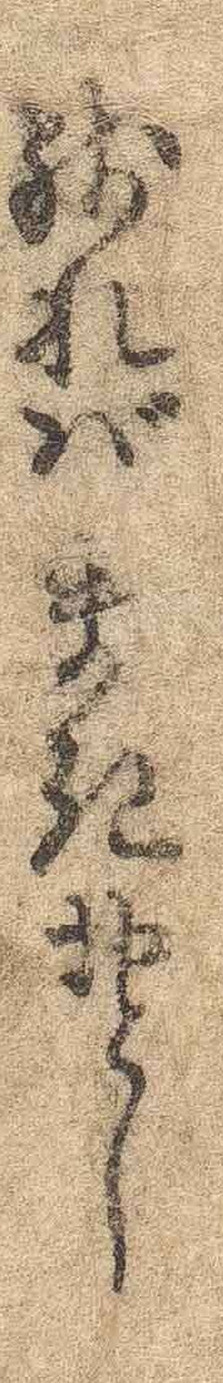残ればまきおとし
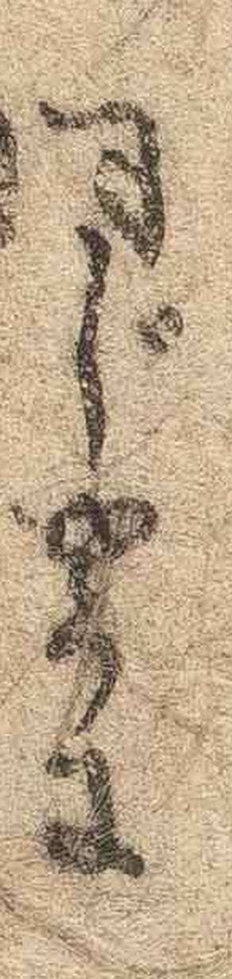同じやうに
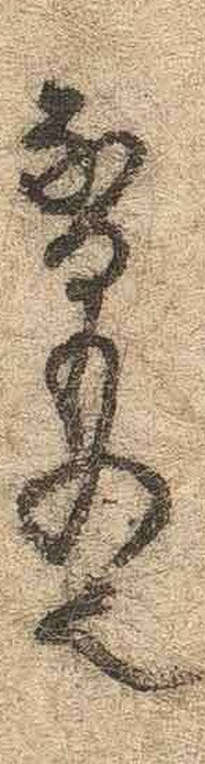なるもの也

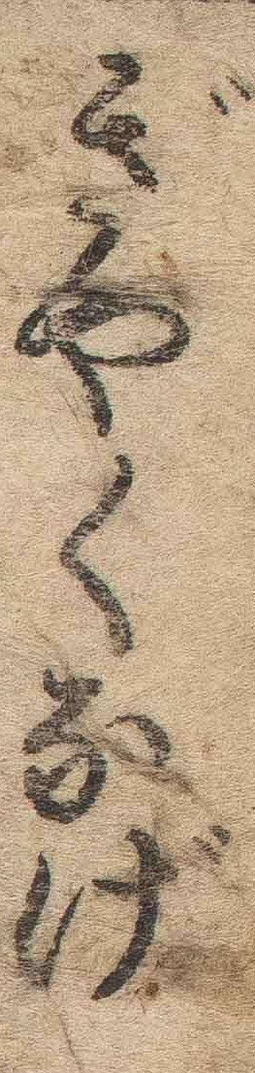ぎやくなげ
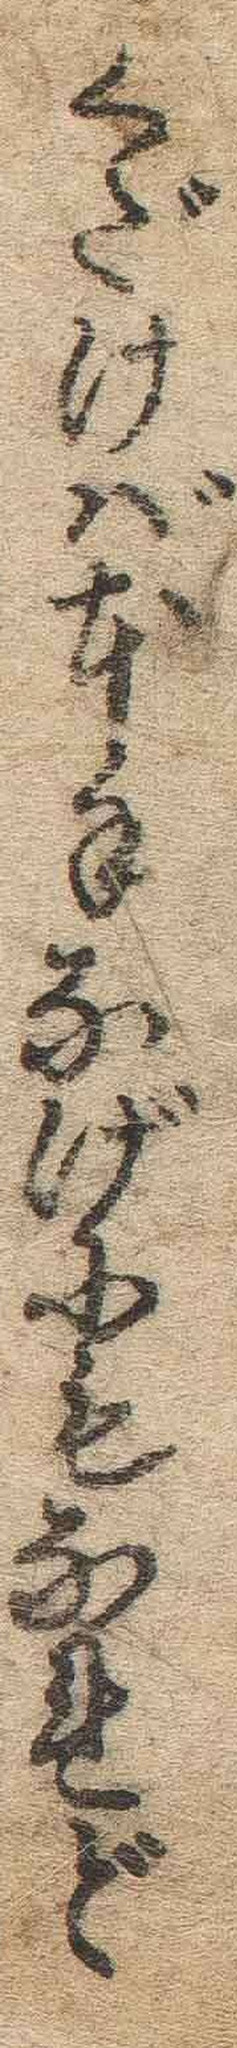くだけば本手なげにもなれど
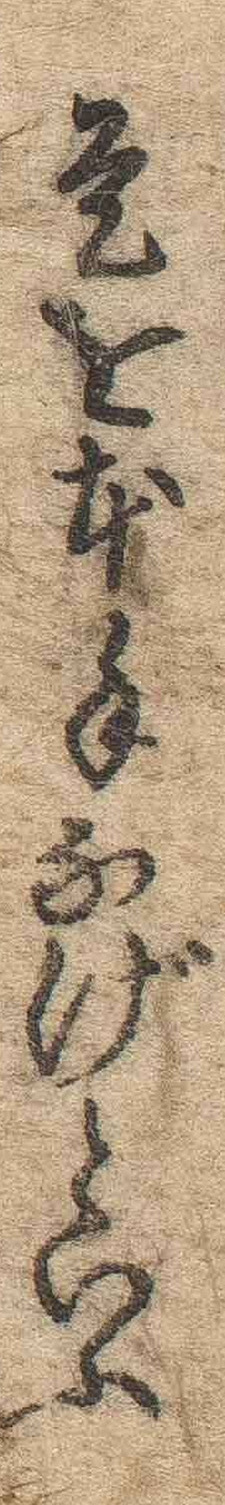是を本手なげといふ
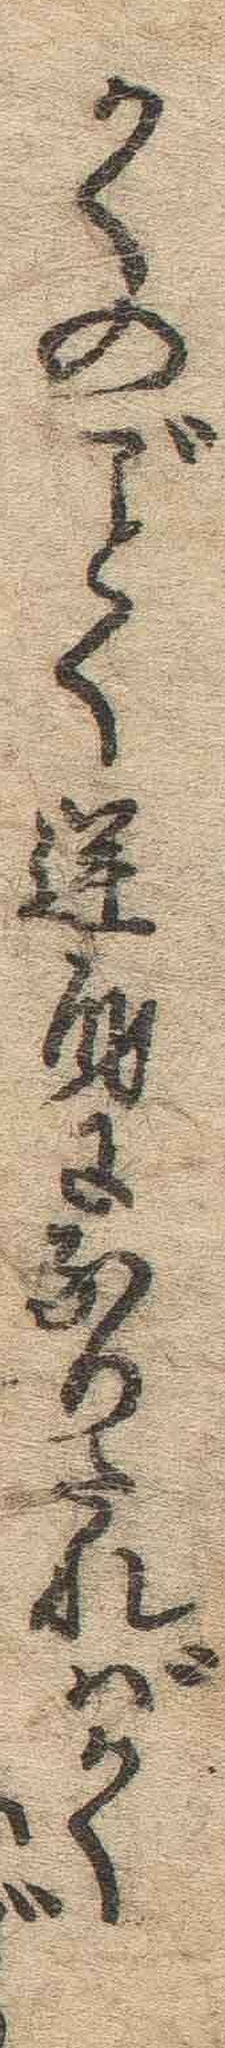かくのごとく逆身になりたればかく
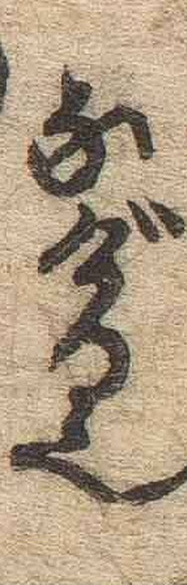なげる也
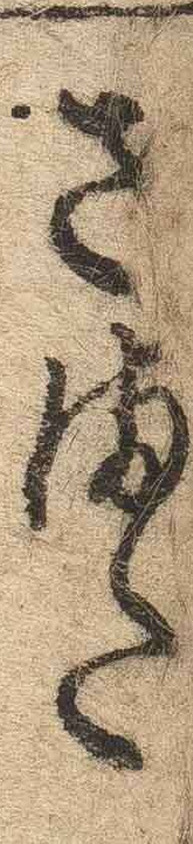さまた
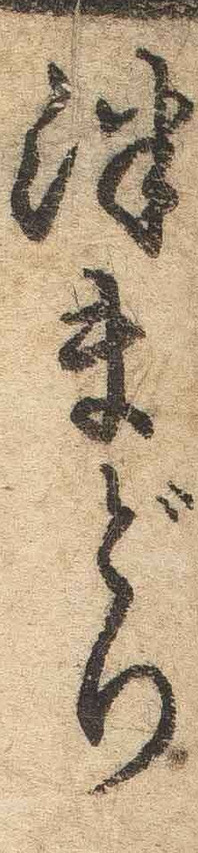つまどり
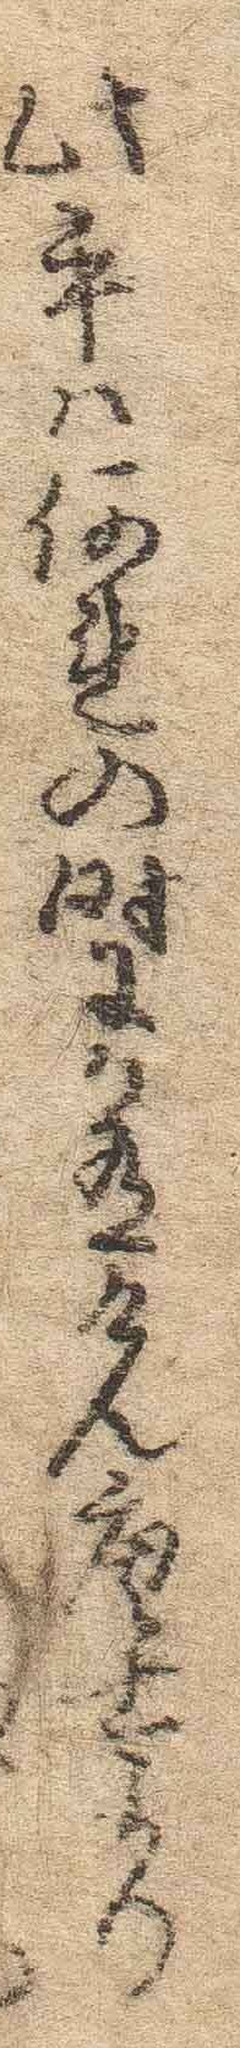此手は何れの時にか有けん唐土より
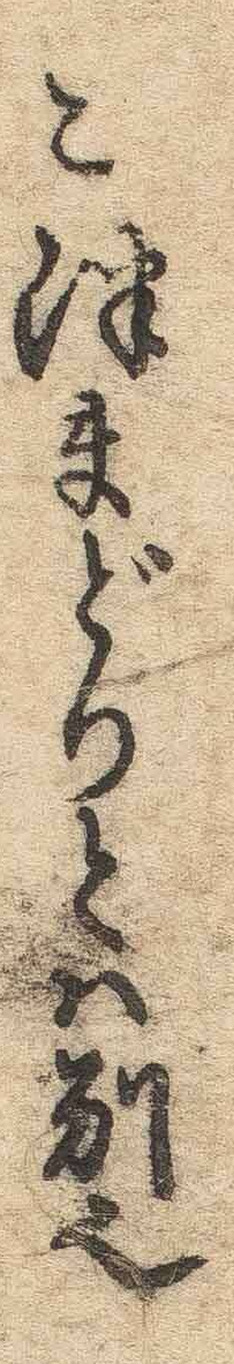こつまどりとは別也
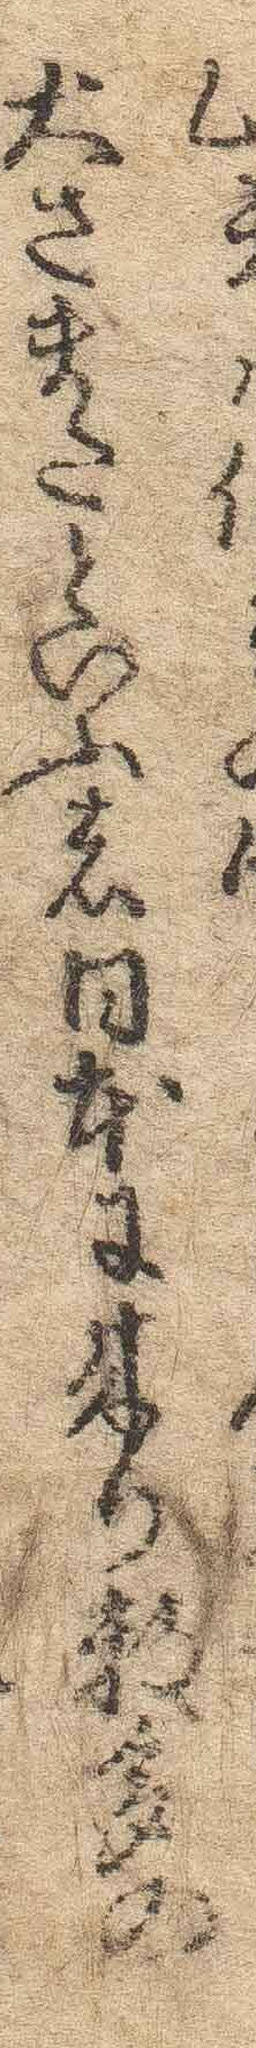大さまたといふ者日本に来り数多の
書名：古今相撲大全
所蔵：東京学芸大学附属図書館 国文学研究資料館
